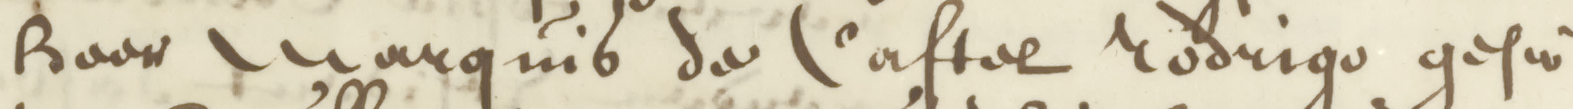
heer Marquis de Castel Rodrigo gesr
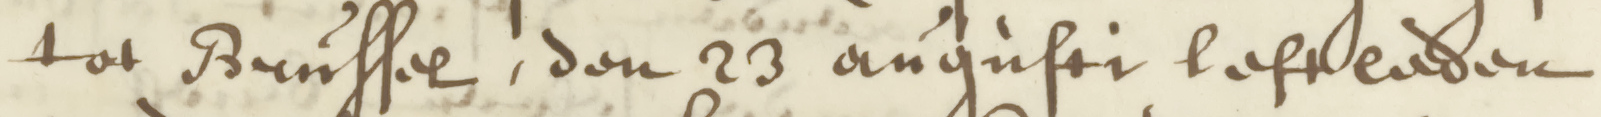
tot Brussel, den 23 augusti lestleden
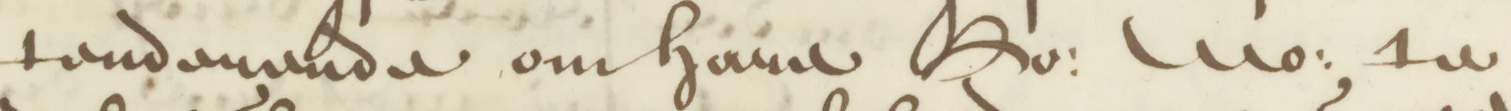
tenderende om hare Ho:Mo: te
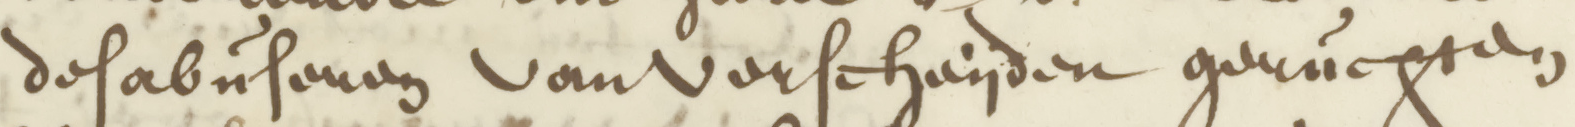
desabuseren van verscheijden geruchten
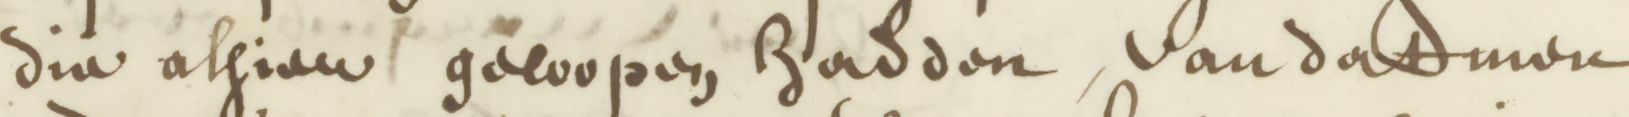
die alhier geloopen hadden, van dat men
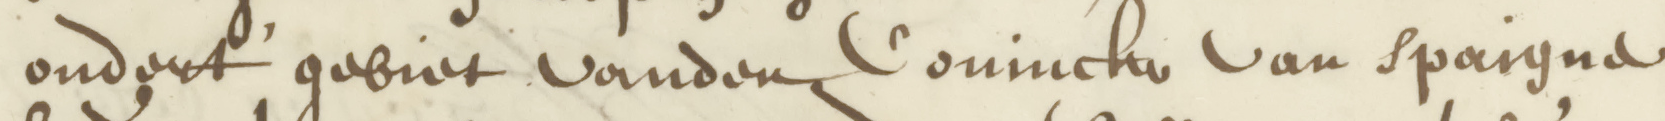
ondert' gebiet vanden Coninck van Spaigne
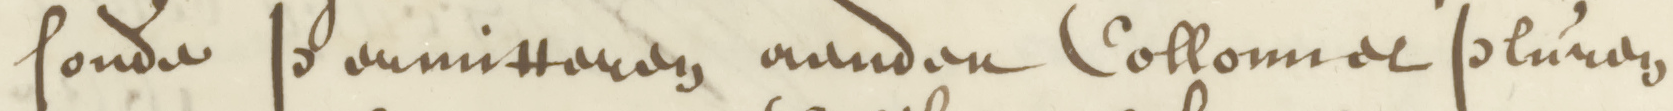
soude permitteren aenden Collonnel pluren
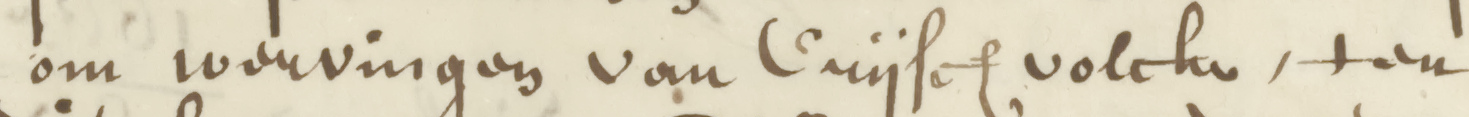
om wervingen van Crijschvolck, ten
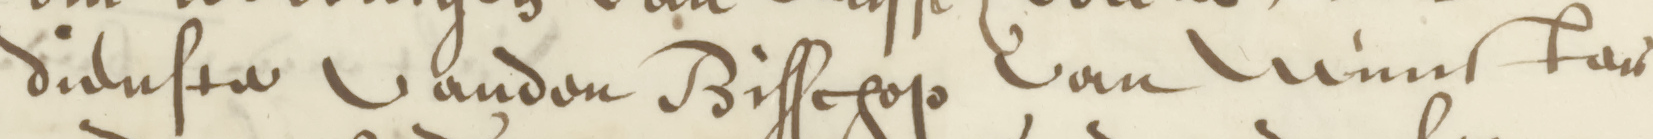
dienste vanden Bisschop van Munster
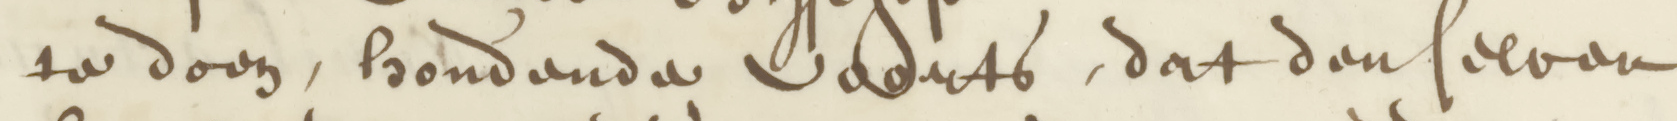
te doen, houdende voorts, dat den selven
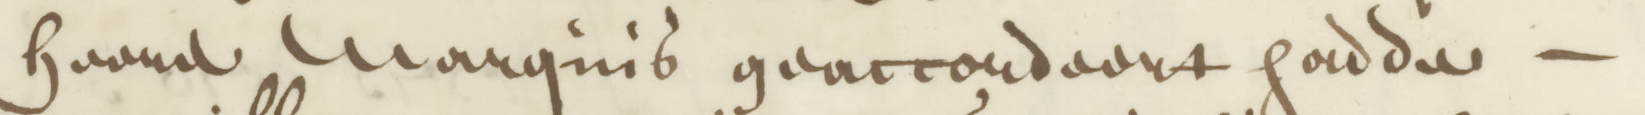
heere Marquis geaccordeert hadde —
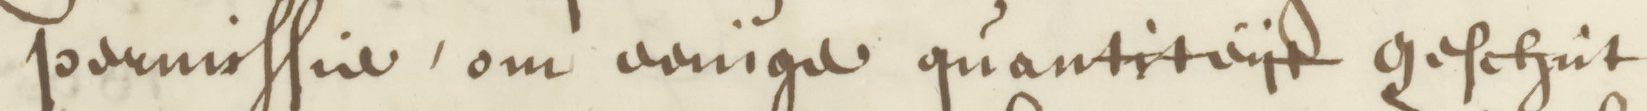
permissie, om eenige quantiteijt geschut
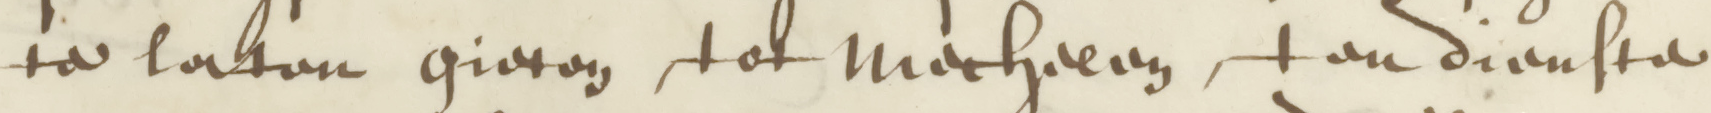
te laten gieten, tot Mechelen, ten dienste
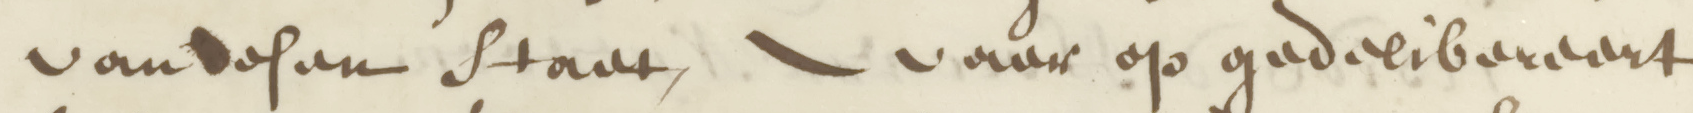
van desen Staet. Waer op gedelibereert
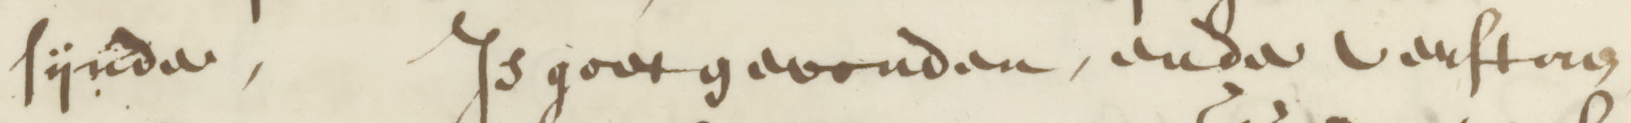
sijnde, Is goetgevonden, ende verstaen
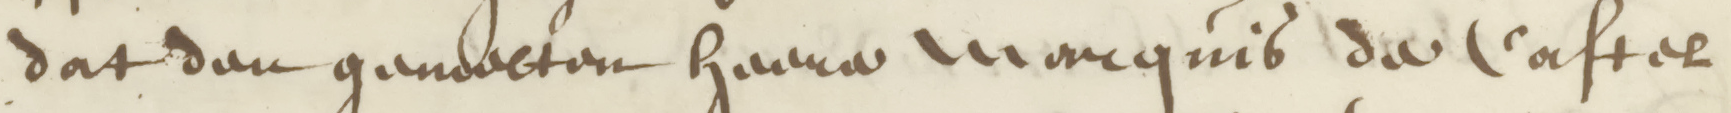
dat den gemelten heere Marquis de Castel
